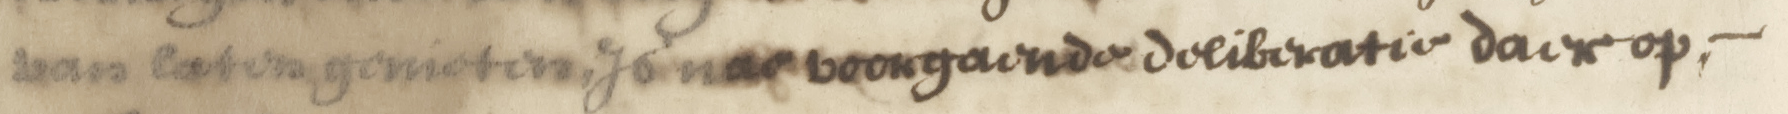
van laten genieten. Is nae voorgaende deliberatie daer op -
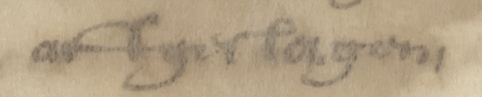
affgeslagen
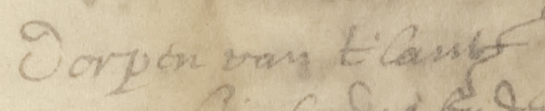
Dorpen van t'lant
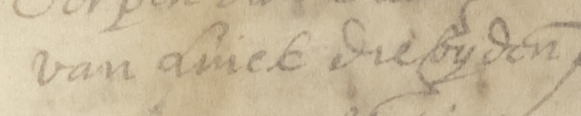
van Luick die by den
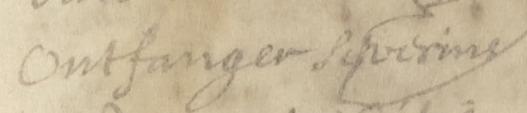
Ontfanger Severins
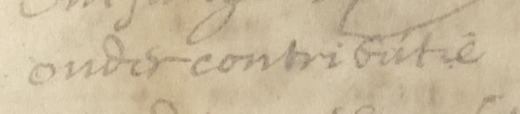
onder contributie
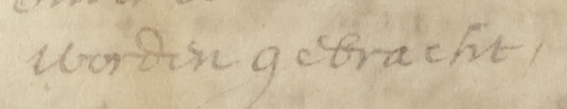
worden gebracht.
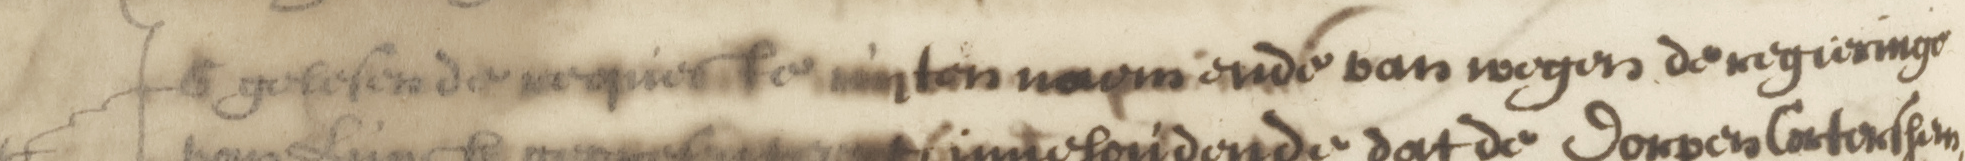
Is gelesen de requeste uyten naem ende van wegen de regieringe
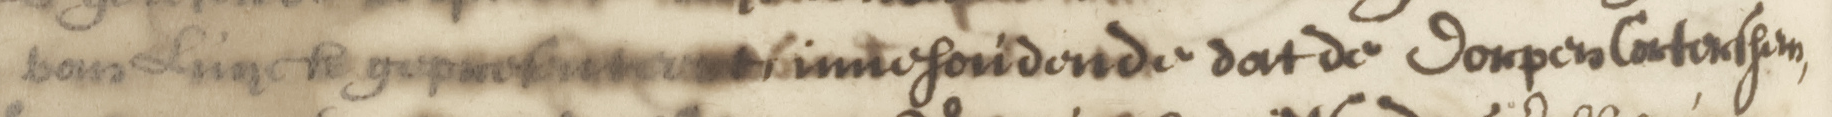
van Luyck gepresenteert innehoudende dat de Dorpen Cortershem,
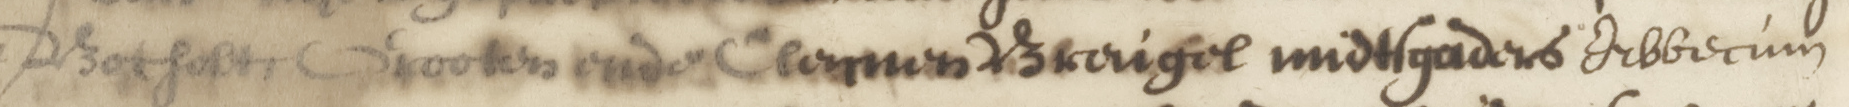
Bocholt, Grooten ende Cleynen Breugel midtsgaders Erbbecum
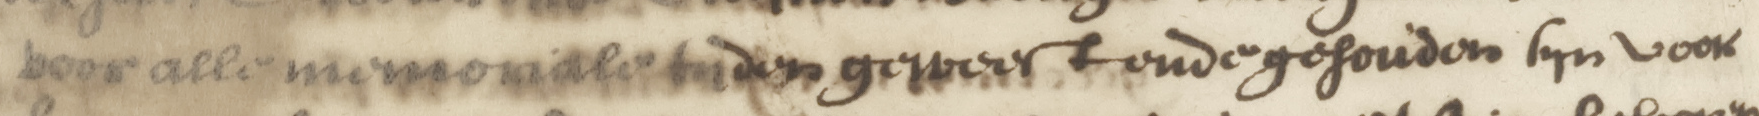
voor alle memoriale tyden geweest ende gehouden syn voor
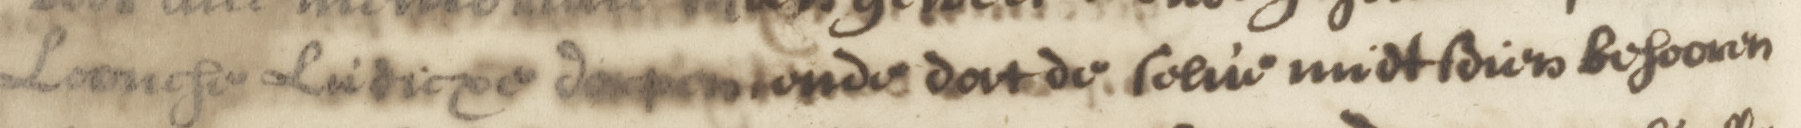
Loonche Ludicxe dorpen ende dat de selue midtsdien behooren
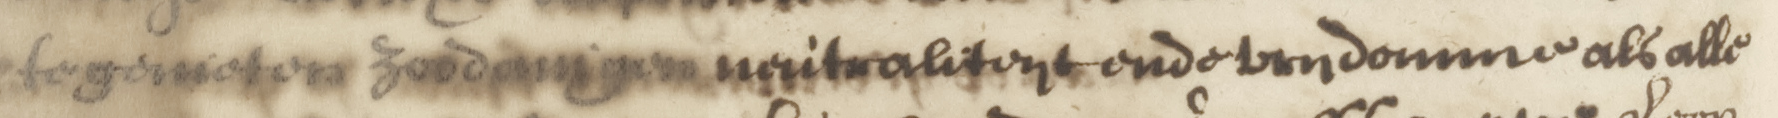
te genieten zoodanigen neutraliteyt ende vrydomme als alle
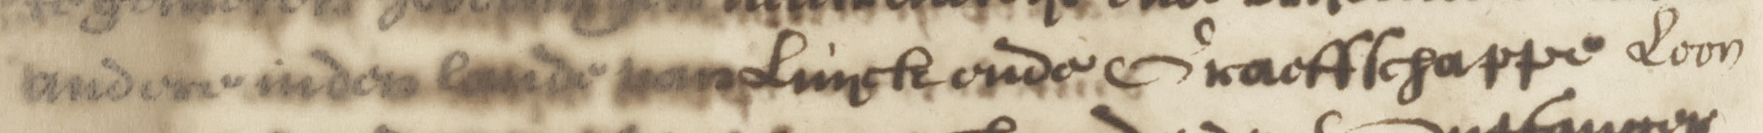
andere inden lande van Luyck ende Graeffschappe Loon
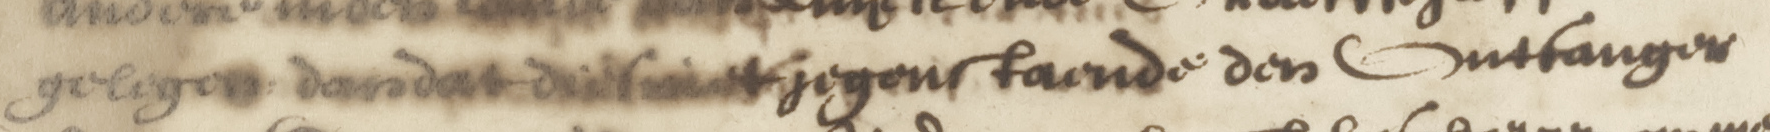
gelegen dan dat dies nietjegenstaende den Ontfanger
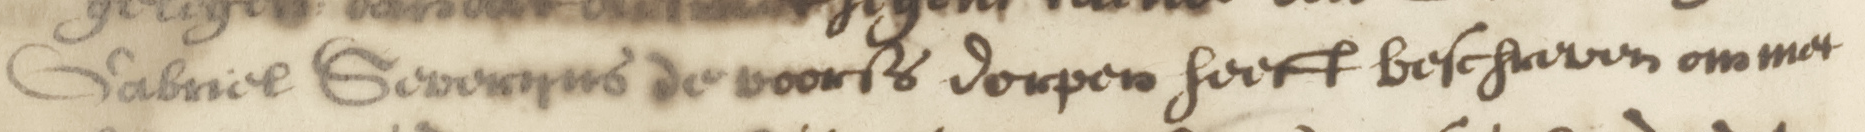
Gabriel Severyns de voors dorpen heeft beschreven om met
